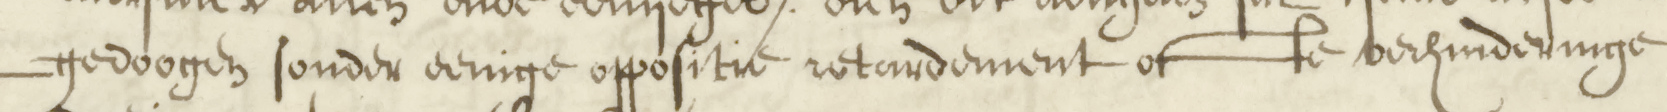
gedoogen sonder eenige oppositie retardement ofte verhinderinge
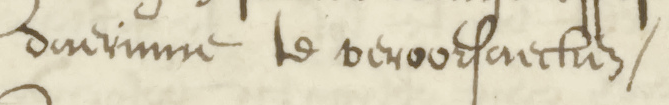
daerinne te veroorsaecken.
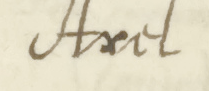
Axel
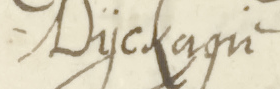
Dijckagie
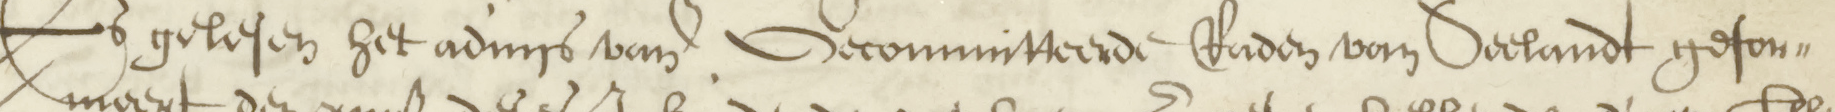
Is gelesen het aduys van Gecommitteerde Raden van Seelandt gefor„
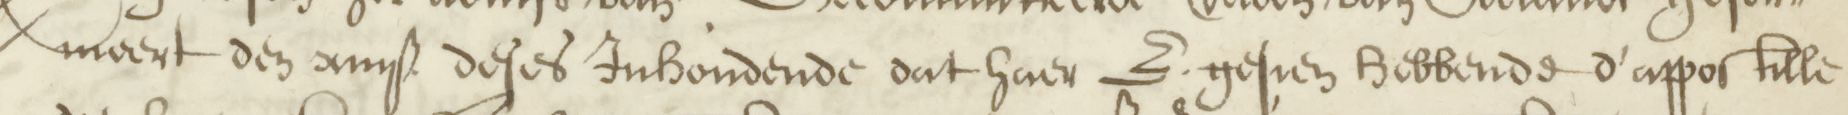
meert den xiiije deses Inhoudende dat haer E. gesien hebbende d'appostille
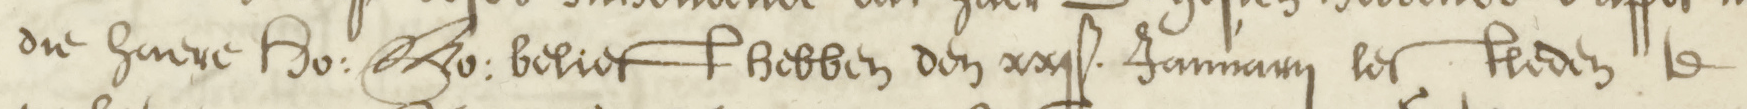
die haere Ho:Mo: belieft hebben den xxje January lestleden te
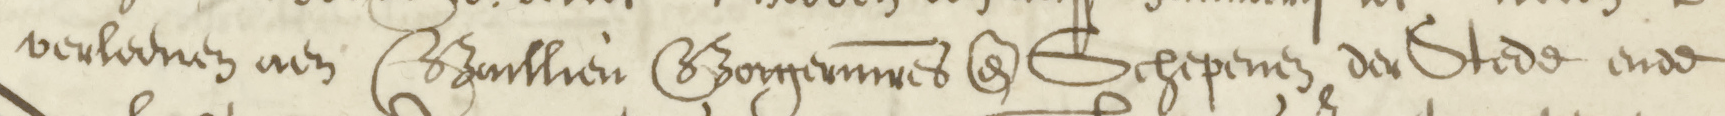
verleenen aen Baillieu Borgermrs. & Schepenen der Stede ende
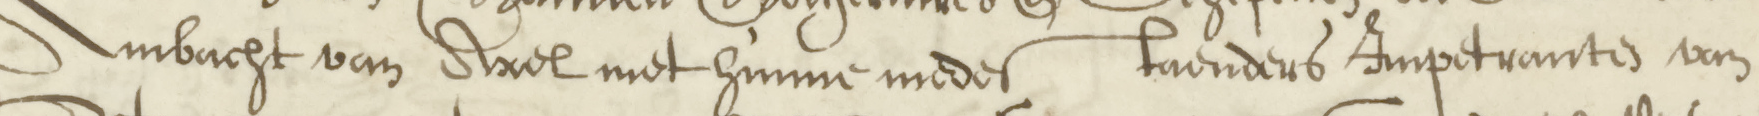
Ambacht van Axel met hunne medestaenders Impetranten van
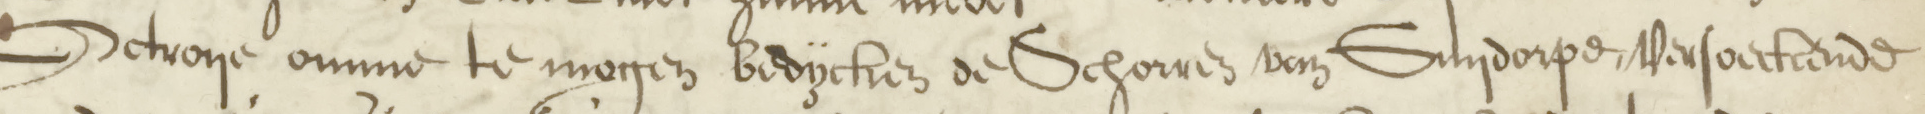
Octroye omme te mogen bedijcken de Schorren van Suydorpe, versoeckende
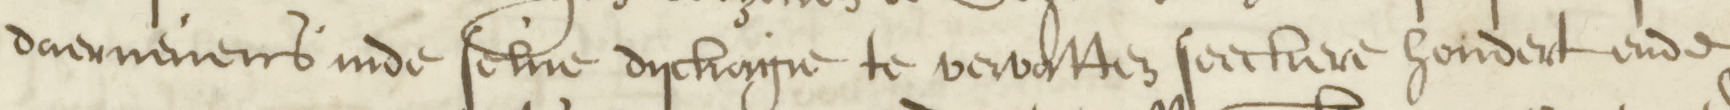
daerneuens inde selue dyckagie te vervatten seeckere hondert ende
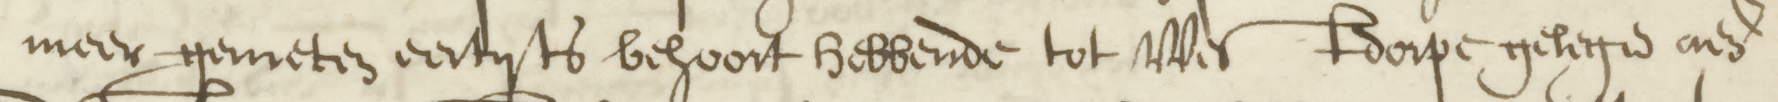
meer gemeten eertyts behoort hebbende tot Westdorpe gelegen aen
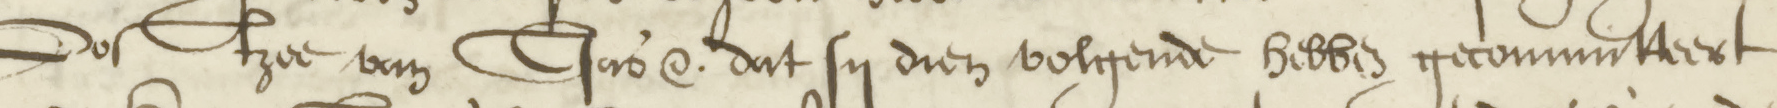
Oostzee van Sas & dat sy dien volgende hebben gecommitteert
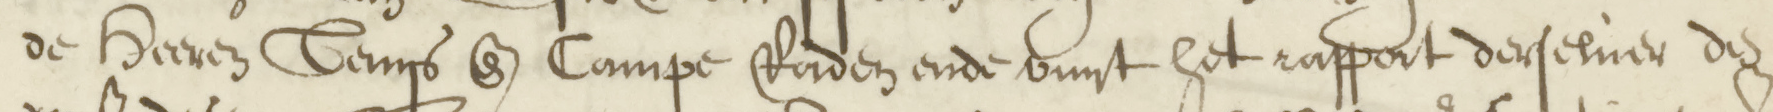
de heeren Tenys & Campe Raden ende vuyt het rapport derseluer den
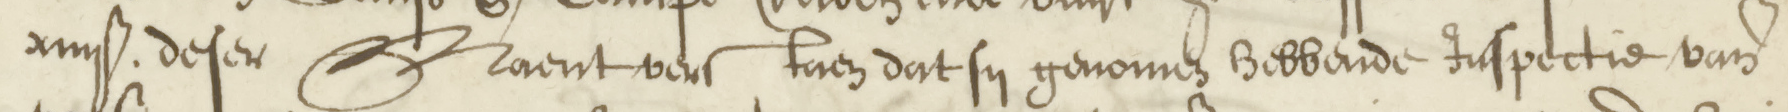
xiiije deser Maent verstaen dat sy genomen hebbende Inspectie van
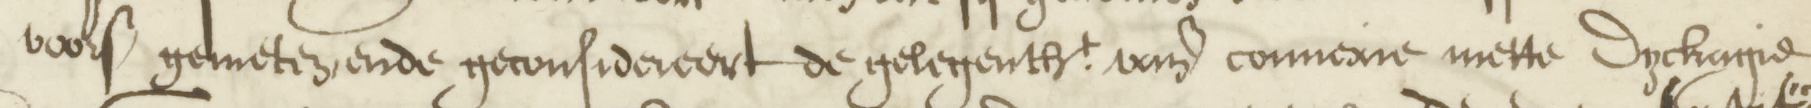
voors gemeten, ende geconsidereert de gelegentht. van connexie mette dyckage
